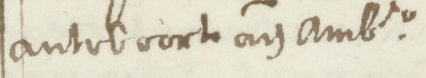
antwoort aen Ambr.
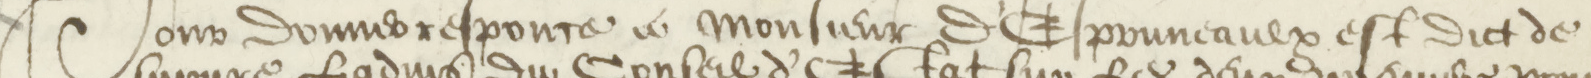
Pour donner responce a monsieur D‛Espruneaulx est Dict de
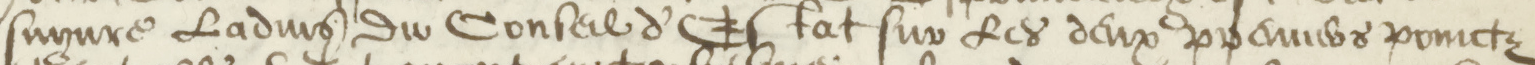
suyure laduis du Conseil d'Etat sur les deux premiers poinctz
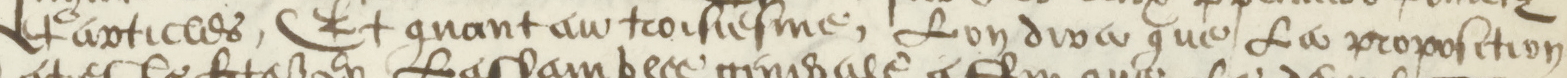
et articles, Et quant au troisiesme, Lon dira que ce proposition
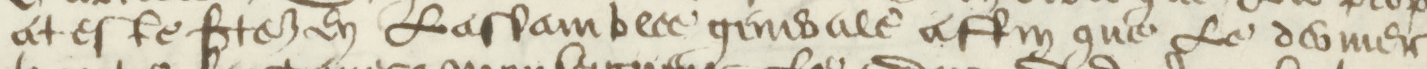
at este pcte en lassamblee generale affin que le donner
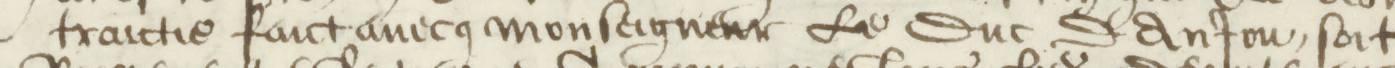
traictie faict avecq monseigneur le Duc D‛Anjou, soit
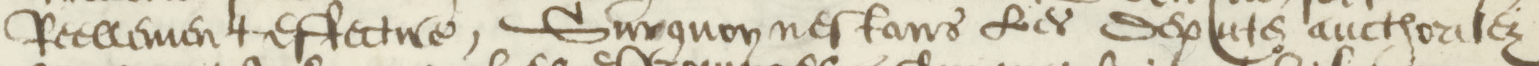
Reellement effectiue, Surquoy nessans les Depute aucthorisez
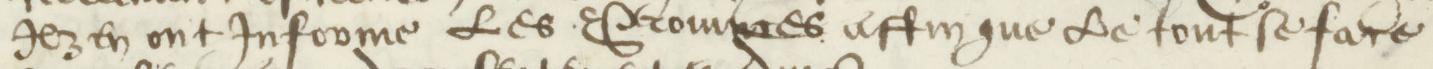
Ilz en ont Informe les Promuces affin que le tout se face
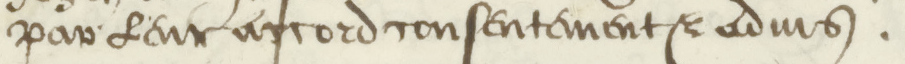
par leur accord consentement e aduis.
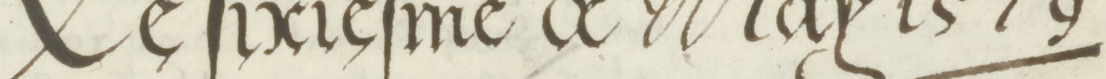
Le Sixieme de May 1579.
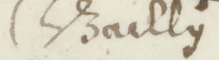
Baillij.
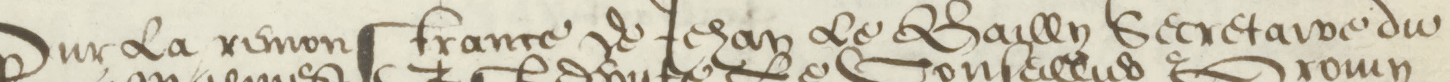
Sur la remonstrance de Jehan le Bailly Secretaire du
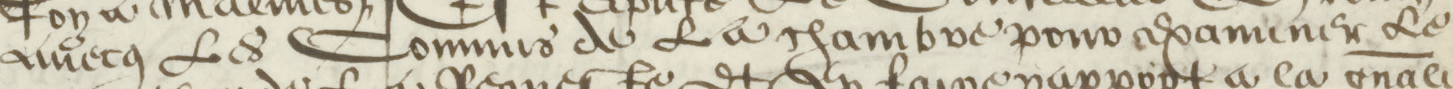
auecq les Commis de la chambre pour examiner le
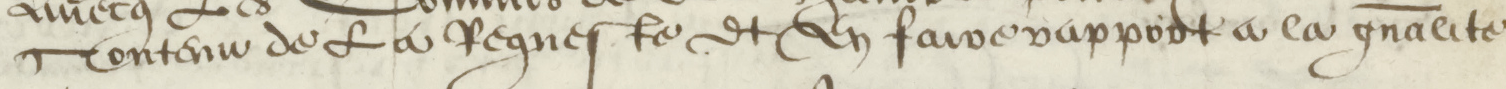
contenu de la Requeste et en faire rapport a la gnalite
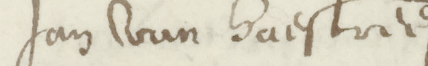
Jan van Haestrecht
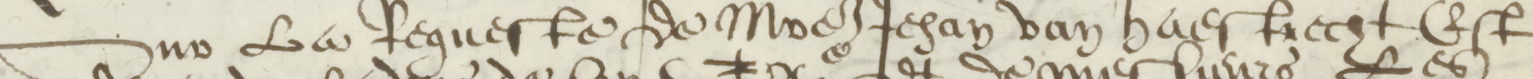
Sur la Requeste de Mre Jehan van Haestrecht Est
